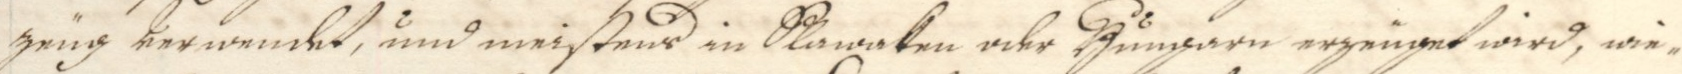zeüg verwendet, und meistens in Slawaken oder Hungarn erzeüget wird, wie-
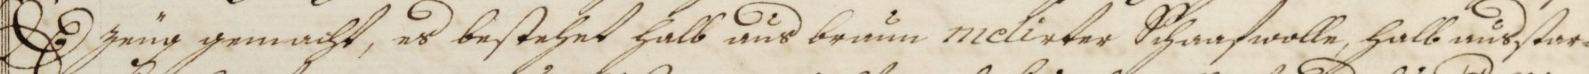zeüg gemacht, es bestehet halb aus braun melirter Schaafwolle, halb aus star-
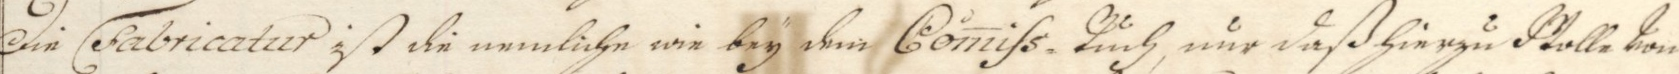Die Fabricatur ist die nemliche wie bey dem Commiss-Tuch, nur daß hierzu Wolle von
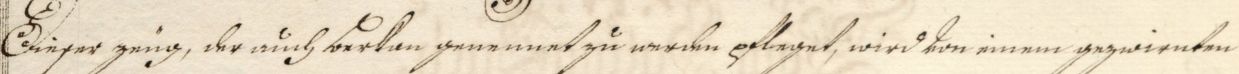Dieser zeüg, der auch Berkan genennet zu werden pfleget, wird von einem gezwirnten
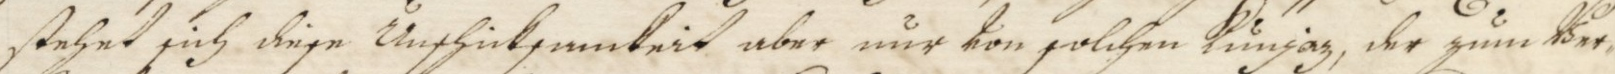stehet sich diese Unschicksamkeit aber nur von solchen Kunjaz, der zum Ver-
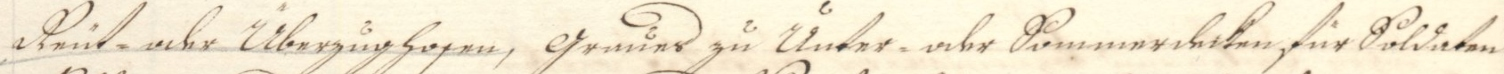Reüt- oder Überzughosen, Graues zu Unter- oder Sommerdecken, für Soldaten
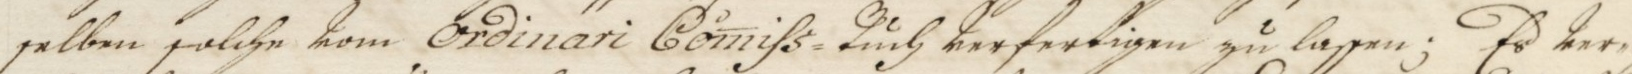selben solche vom ordinari Commiss-Tuch verfertigen zu lassen. Es ver-
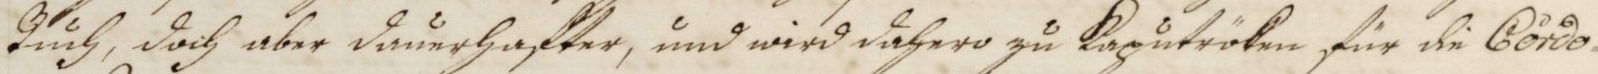Tuch, doch aber dauerhafter, und wird dahero zu Kaputröken für die Cordo-
